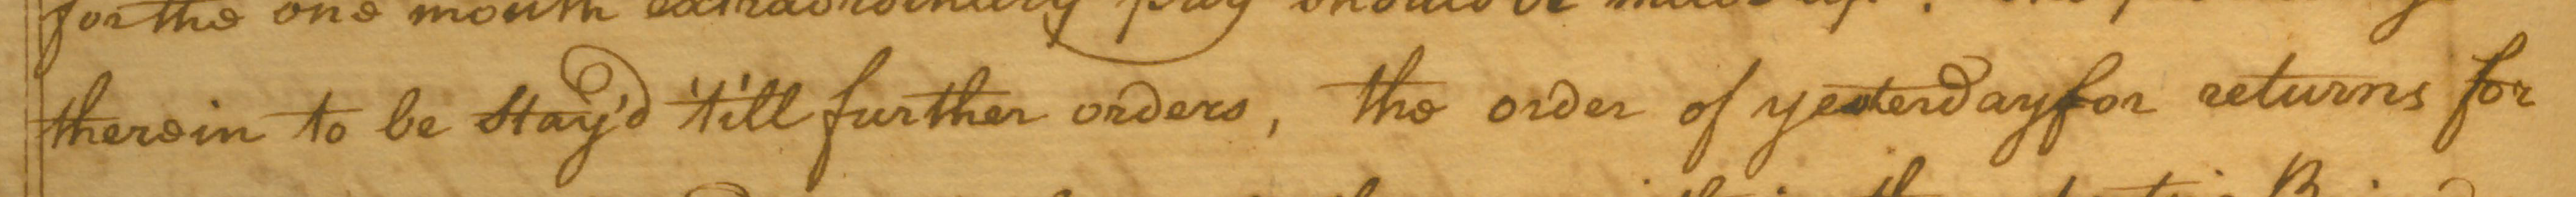therein to be stay'd 'till further orders, the order of yesterday for returns for
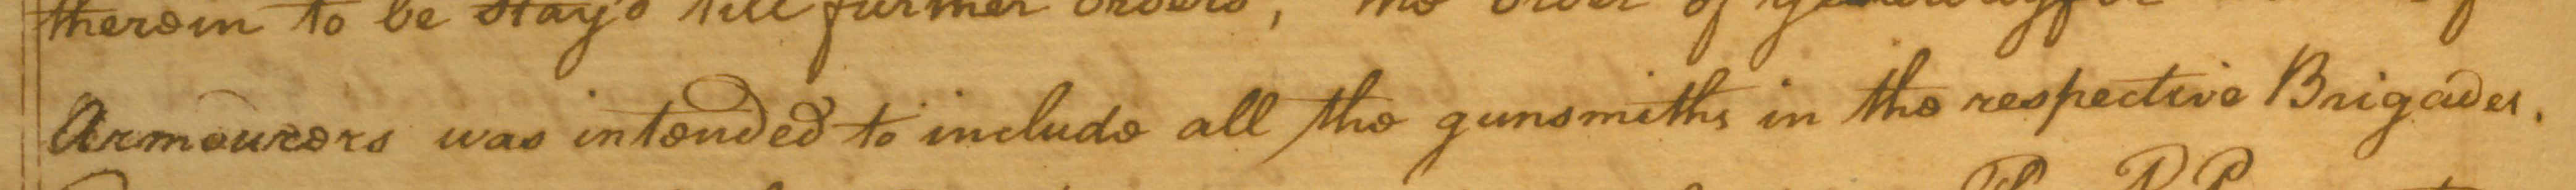Armourors was intended to include all the gunsmiths in the respective Brigades.
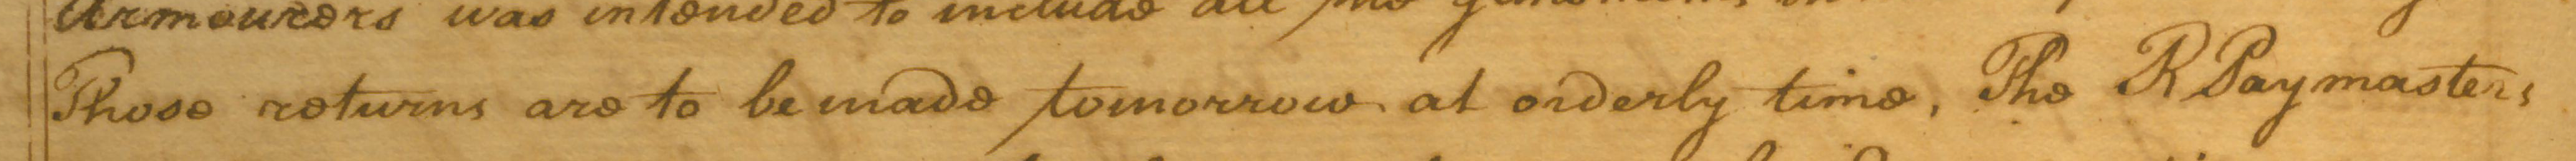Those returns are to be made tomorrow at orderly time. The R Paymasters
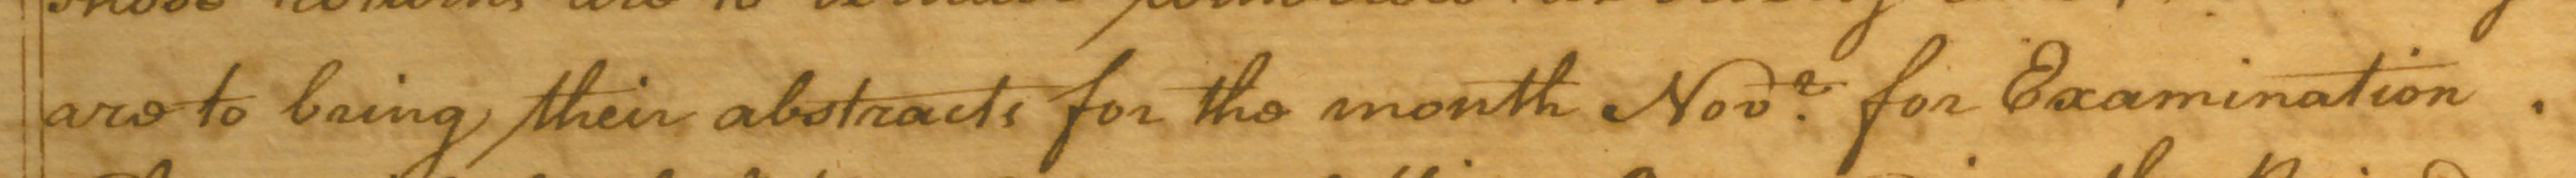are to bring their abstracts for the month Nov^r. for Examination.
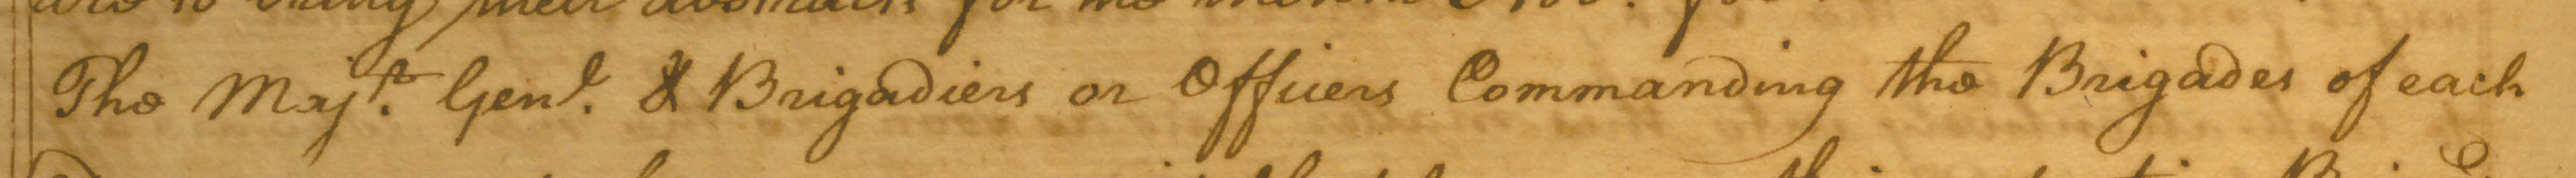The Maj^r. Gen^l. & Brigadiers or Officers Commanding the Brigades of each
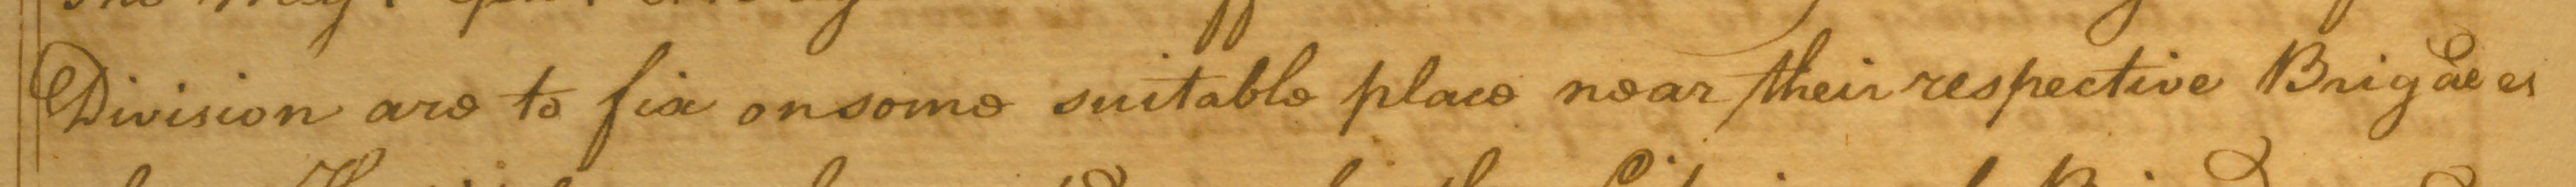Division are to fix on some suitable place near their respective Brigades
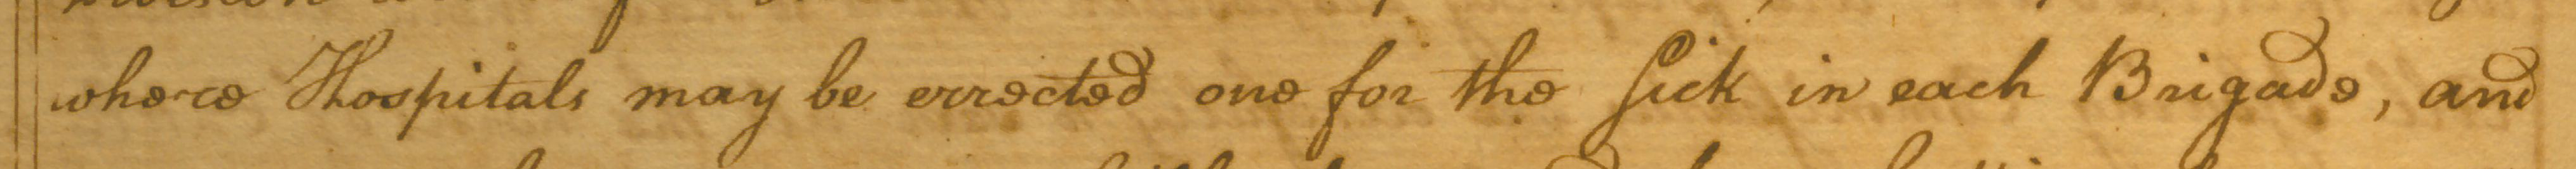where Hospitals may be errected one for the Sick in each Brigade, and
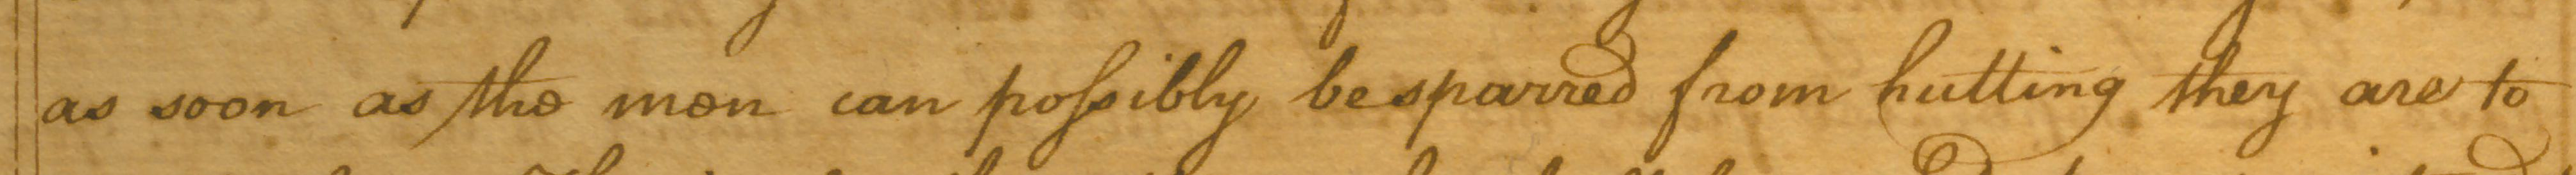as soon as the men can possibly be sparred from hutting they are to
